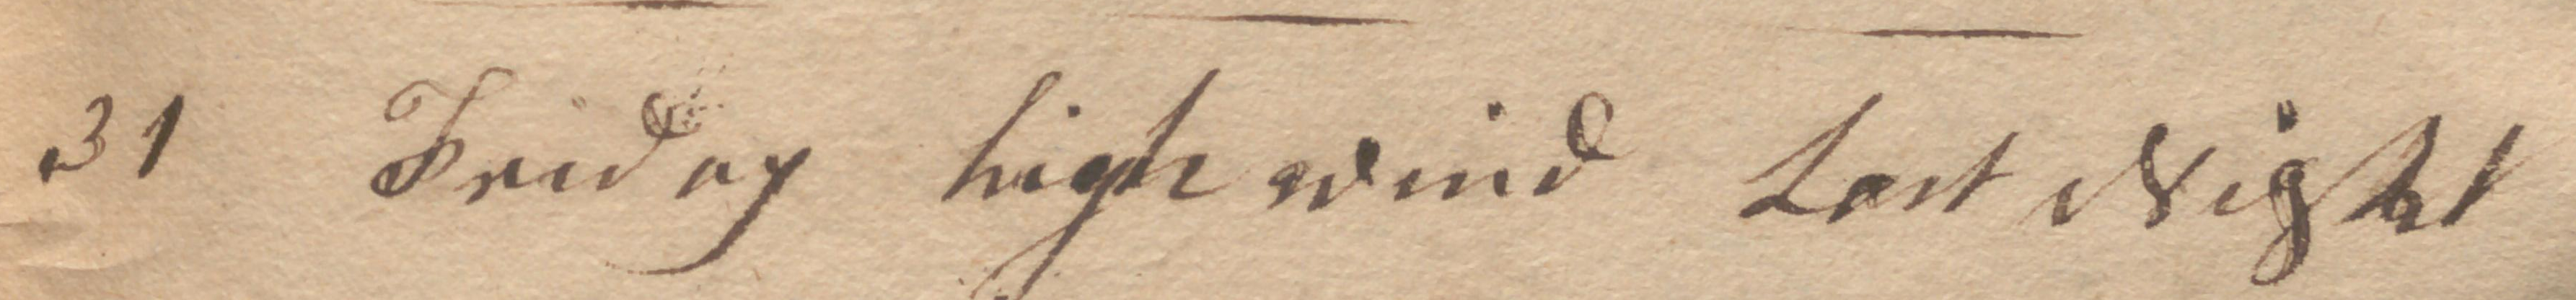31 Friday high wind Last Night
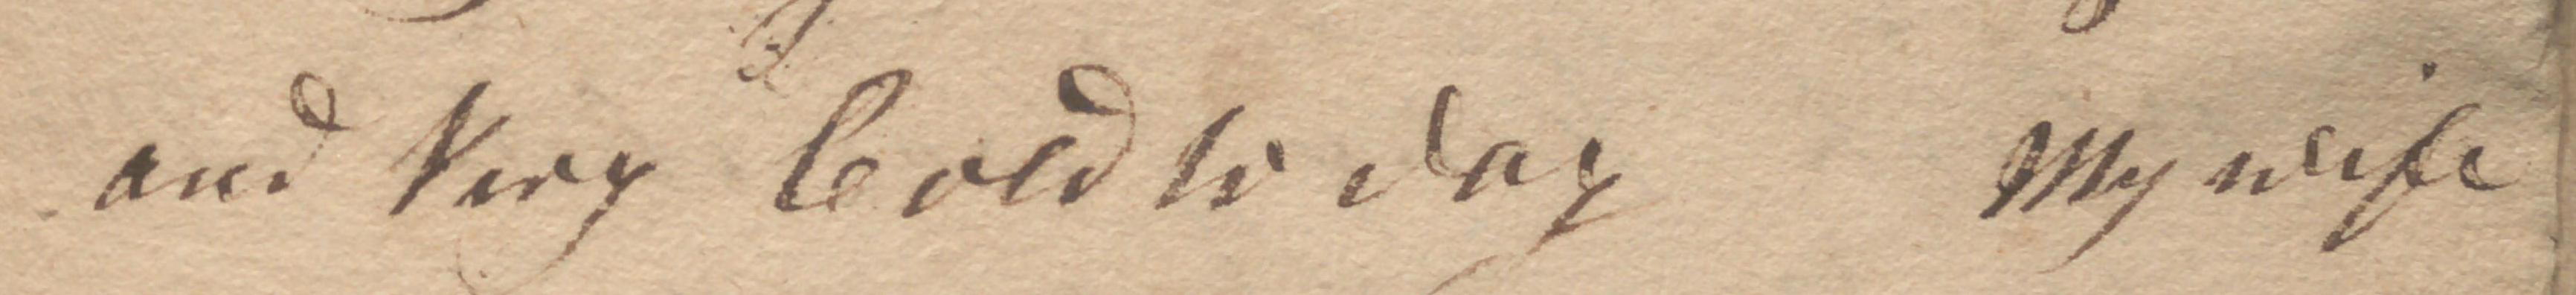and Very Cold to day My wife
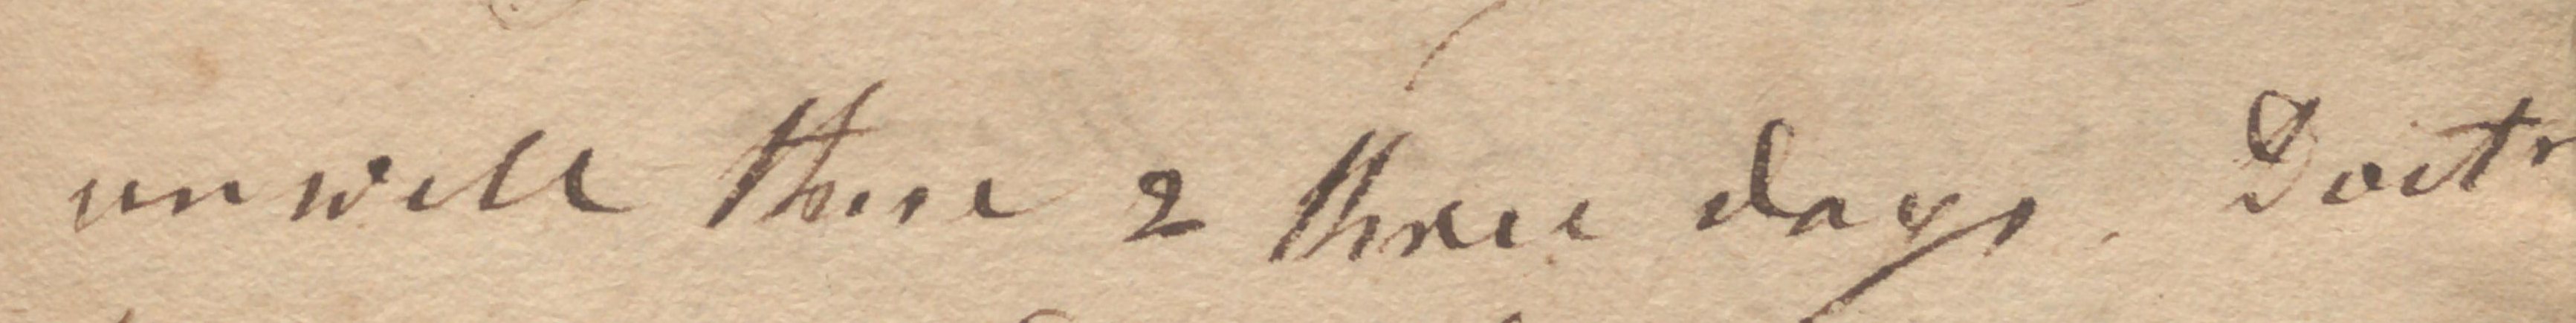unwell these 2 three days, Doct^r
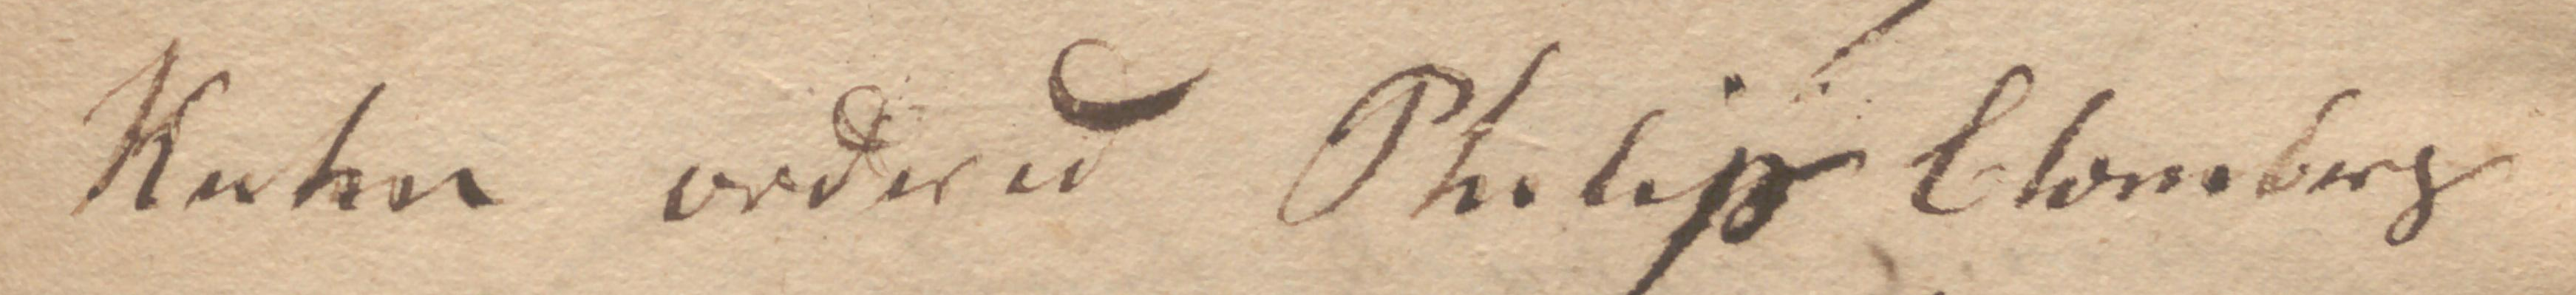Kuhn ordered Philip Clomberg
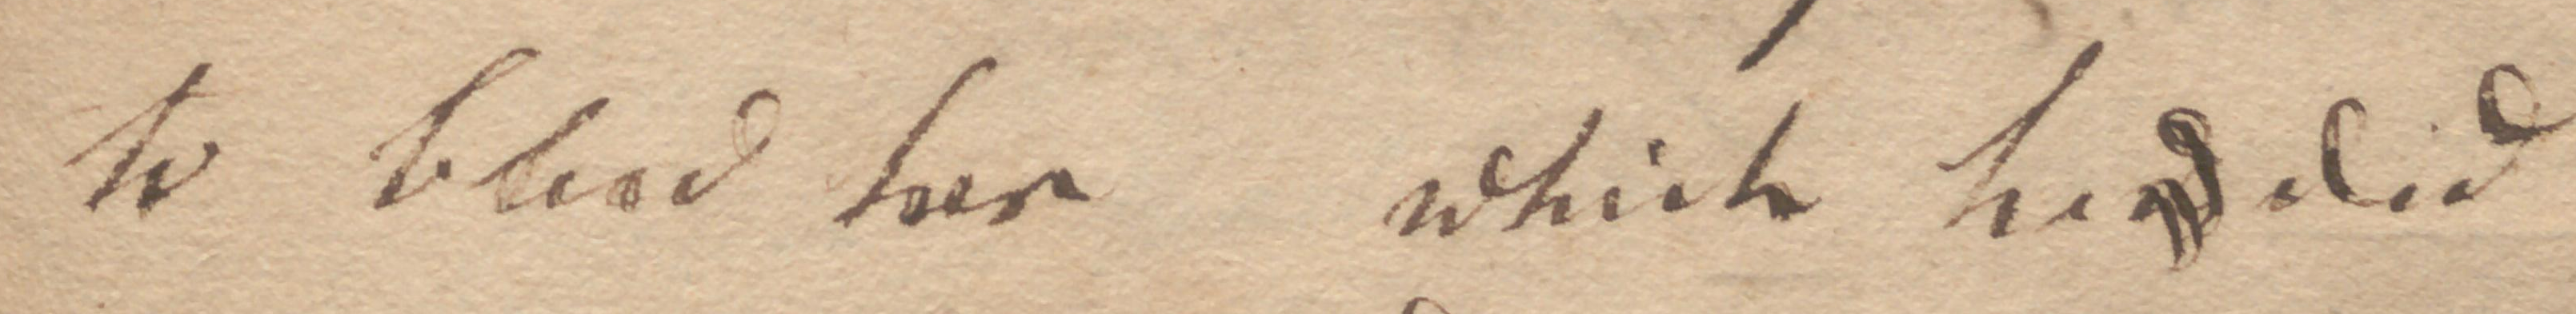to bleed her which he did
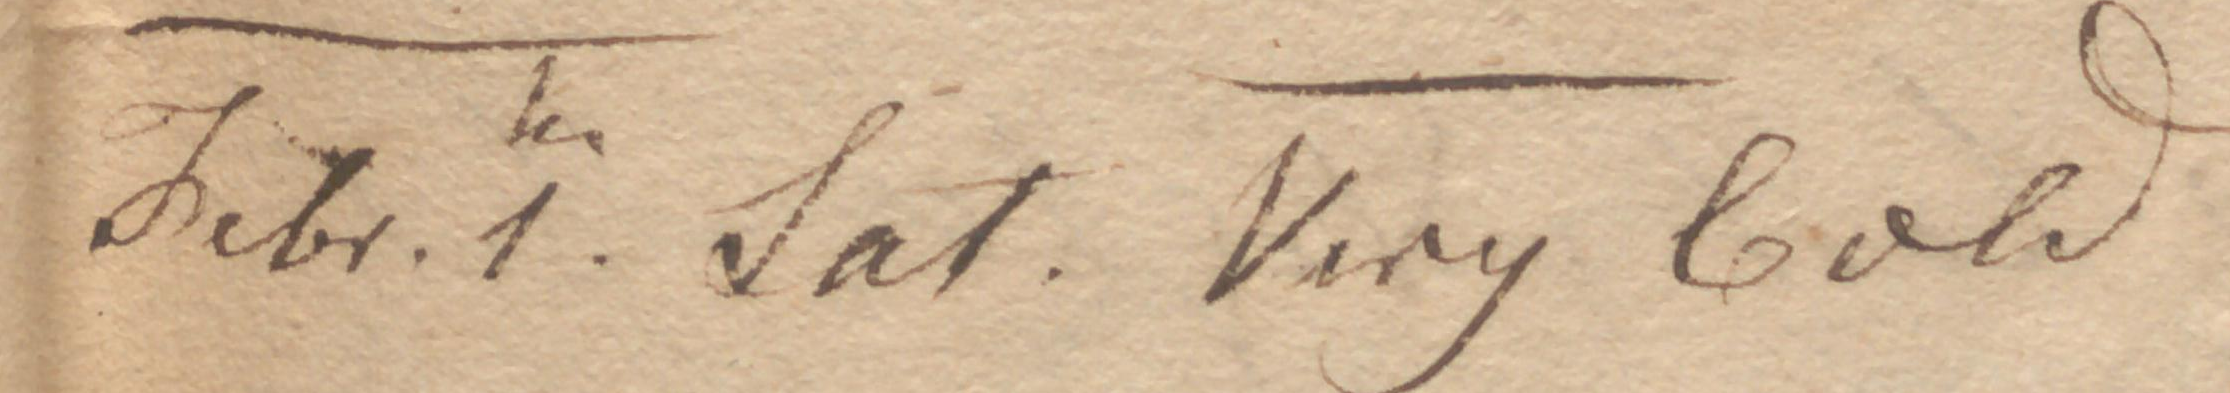Febr. 1^t. Sat. Very Cold
